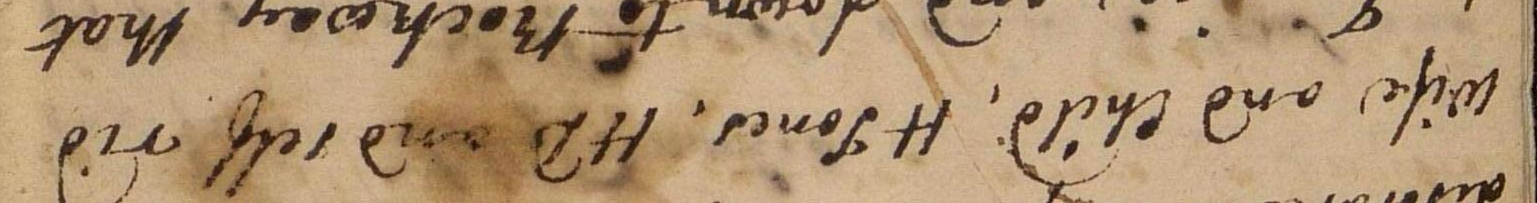Wife and Child, H Jones, HD and self rid
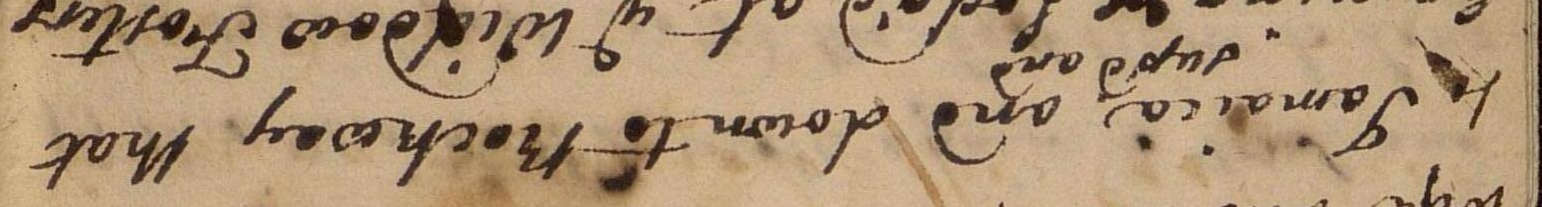to Jamaica and down to Rockway that
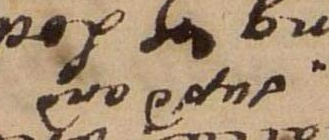sup'd and
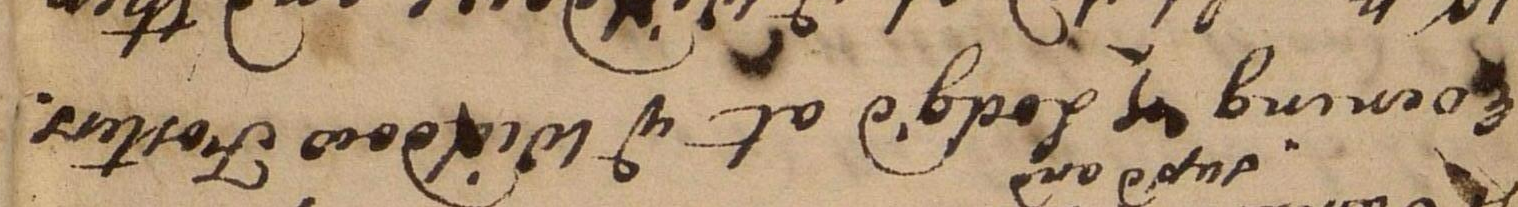Evening & Lodg'd at Widow Fosters.
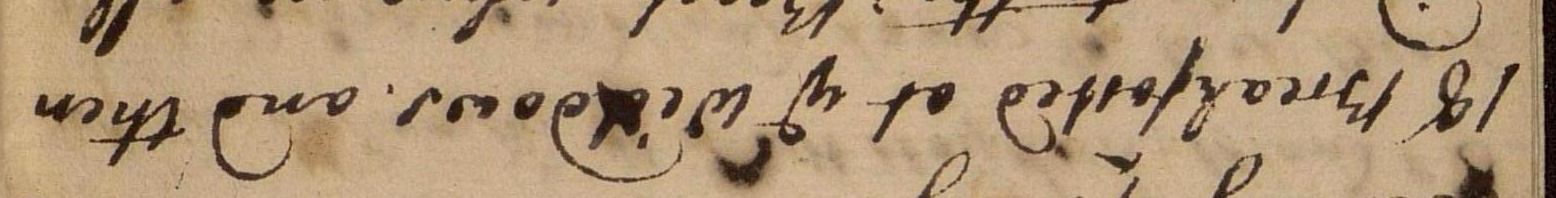18 Breakfasted at y^e Widows and then
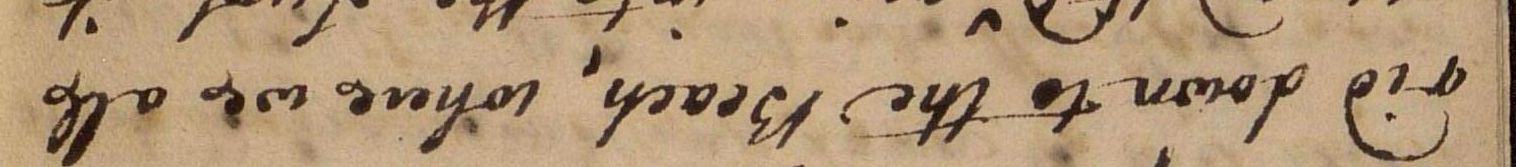rid down to the Beach, where we all
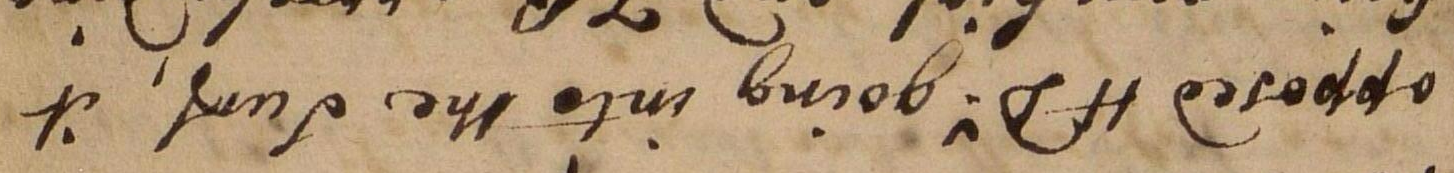opposed HD^s. going into the Surf, it
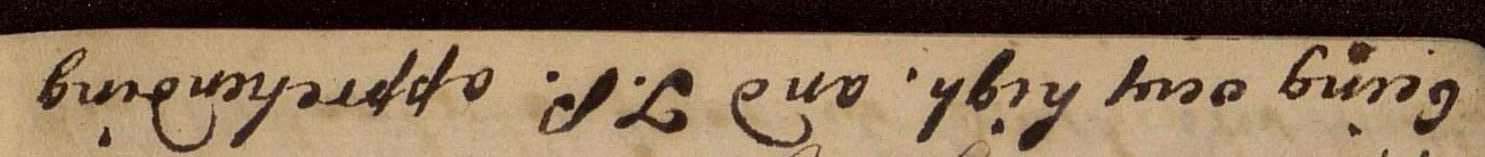being very high. and T. P. apprehending
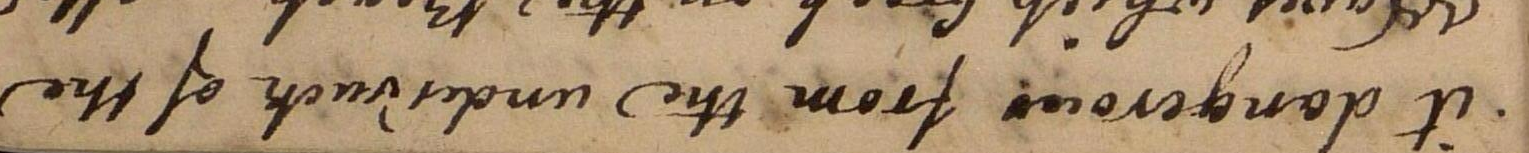it dangerous from the under suck of the
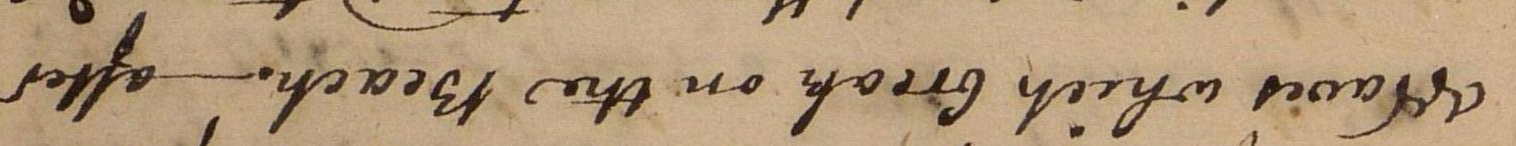Waves which break on the Beach.- after
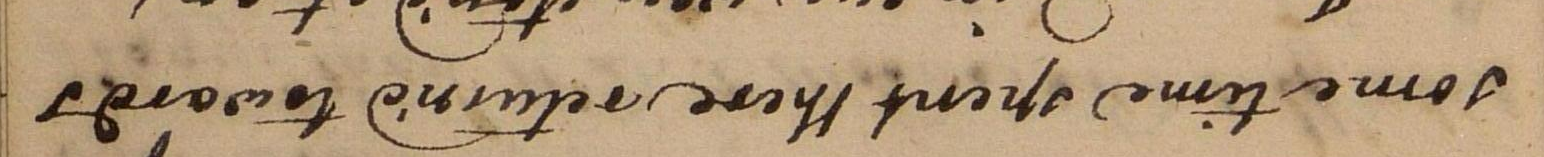some time spent there return'd towards
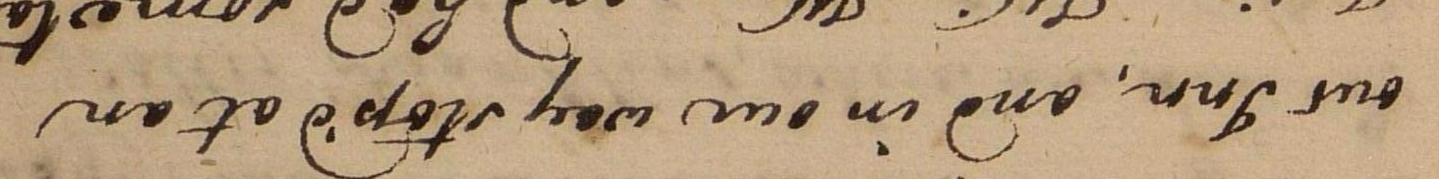our Inn, and in our way stop'd at an
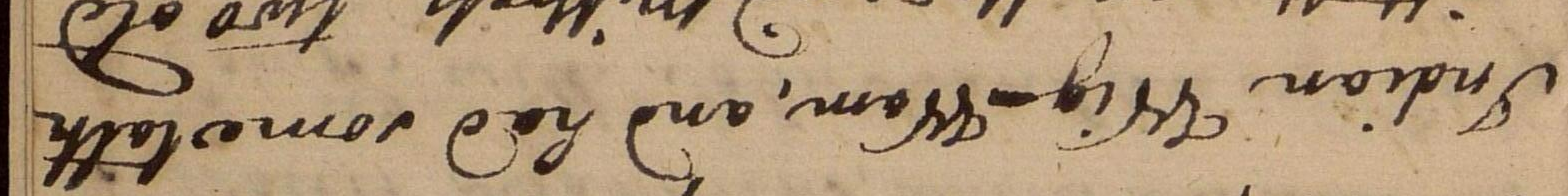Indian Wig-Wam, and had some talk
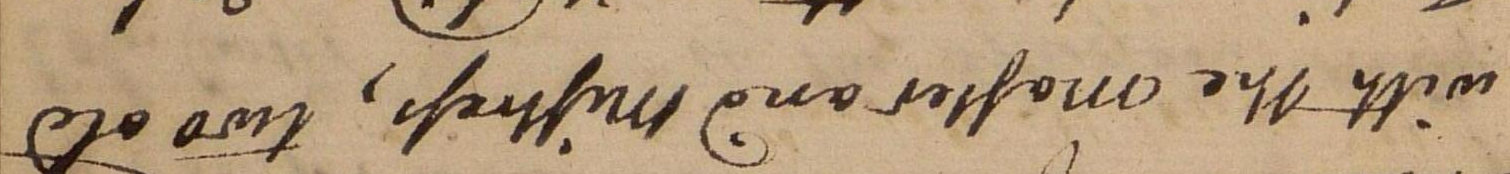with the Master and Mistress, two old
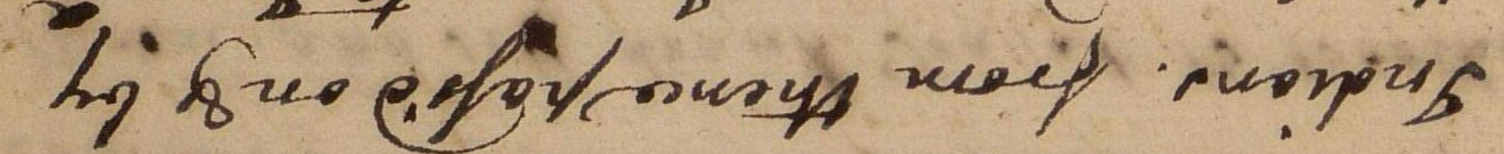Indians. from thence pass'd on & by
